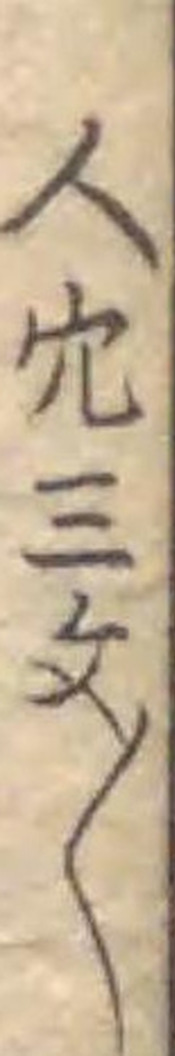人穴三文〳〵
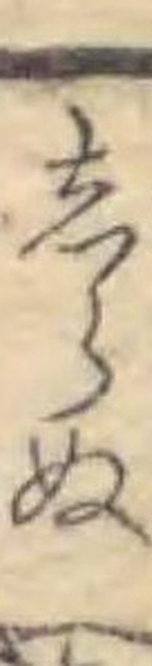しらぬ
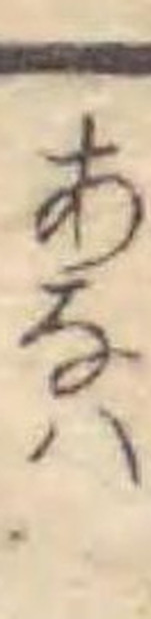あなは
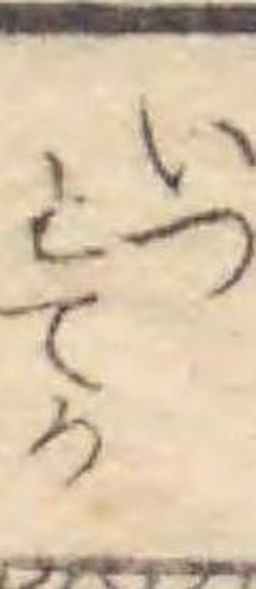とてか
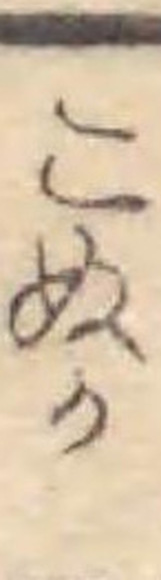こぬか
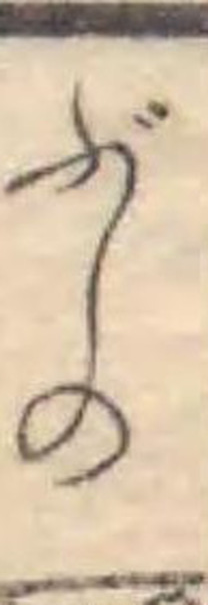ぶしの

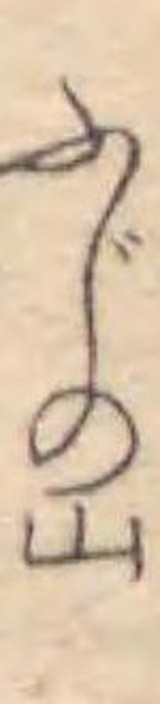ふじの山
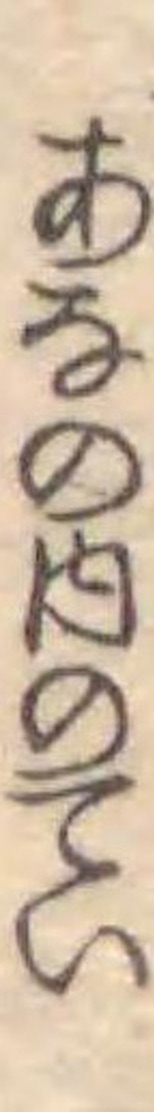あなの内のてい
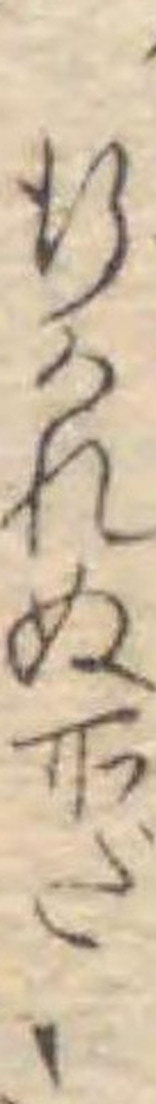行かれぬ所だ
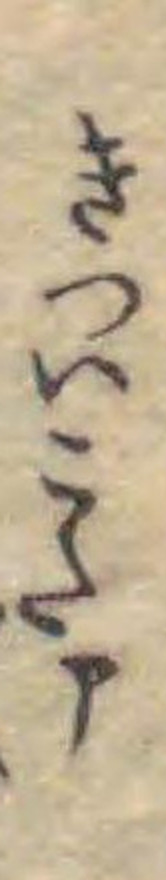きついこたァ
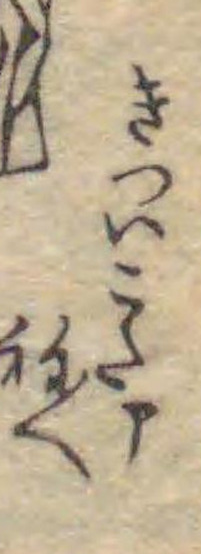きついこたァ
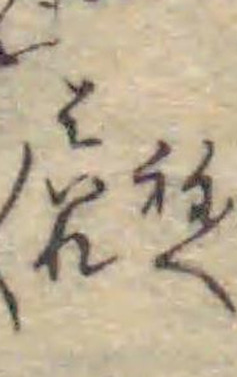はいれ

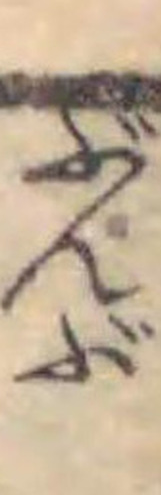ぶんぶ
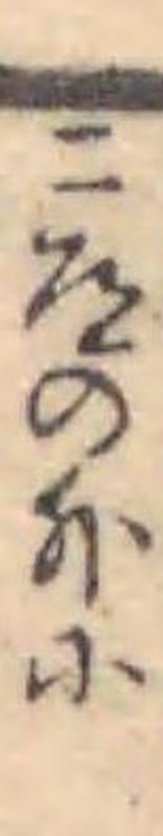二道の外に
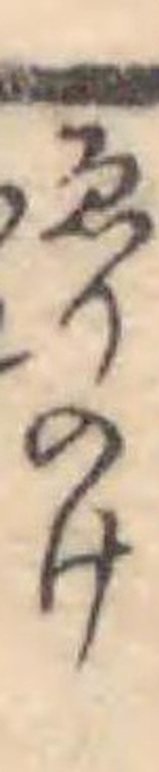ゑりのけ
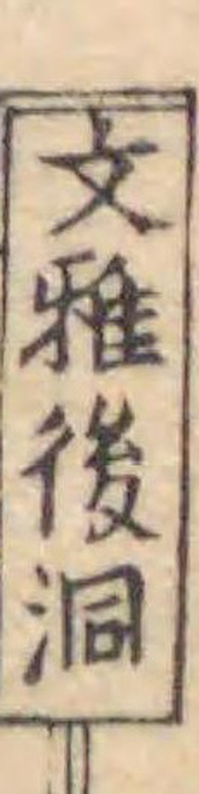文雅後洞
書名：文武二道万石通 : 3巻
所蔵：国立国会図書館 National Diet Library, JAPAN
